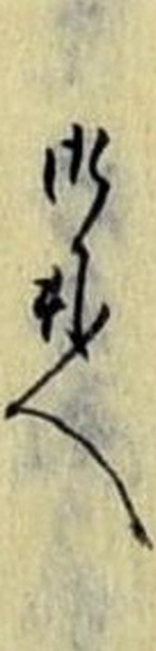御用人
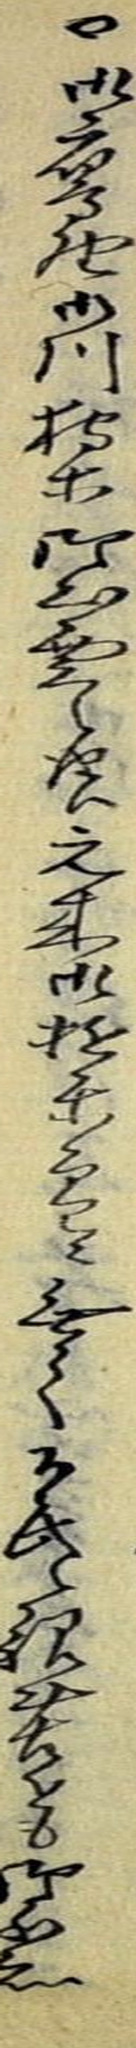○御鷹野御川狩等御出殿之儀は元来御遊楽而己に無之下民之難苦をも御承知
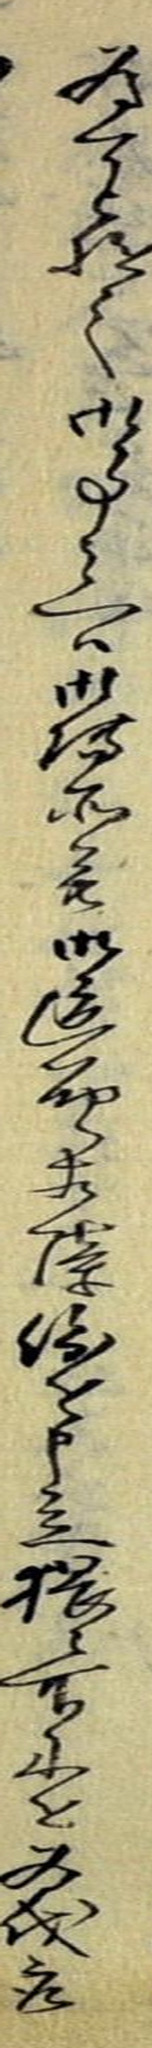為可被遊御事に候へは御場所并御道筋へ相障儀を申立猥に所木を為伐取
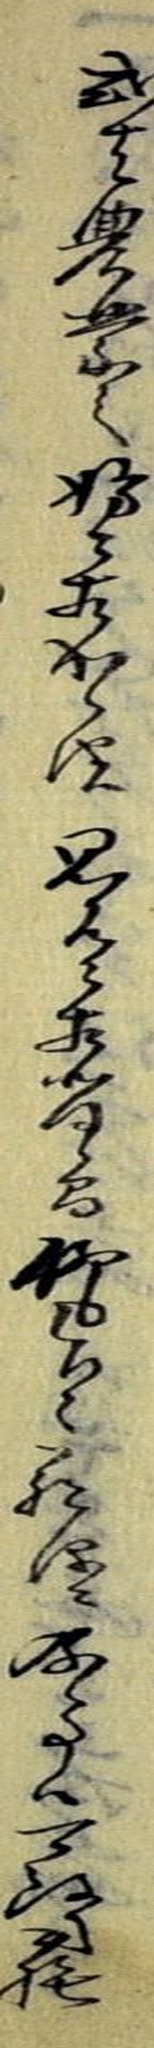或は農業之妨に相成候儀は思召に相背候間聊も下々難儀に及候事は可致用捨
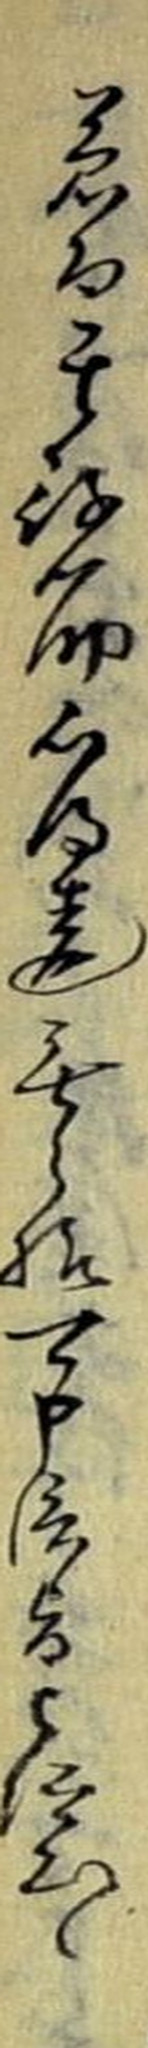兼而其役筋心得違無之様可申渡旨被仰出候
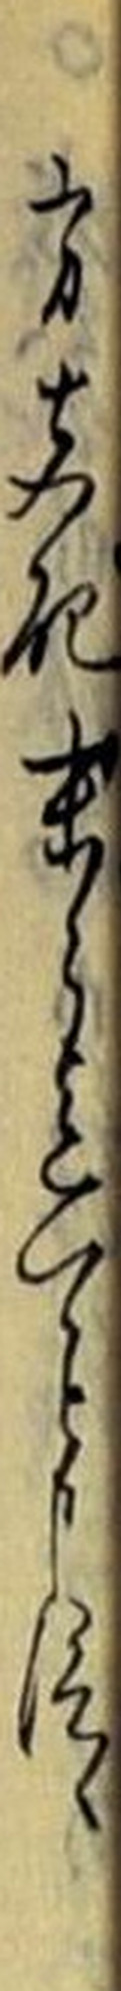方支配末々迄可被申渡候
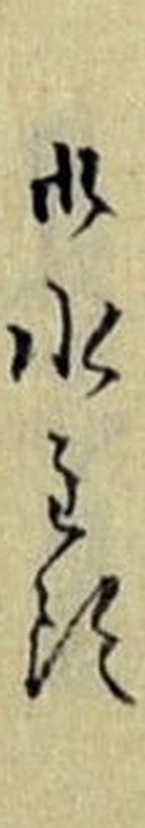御水主頭
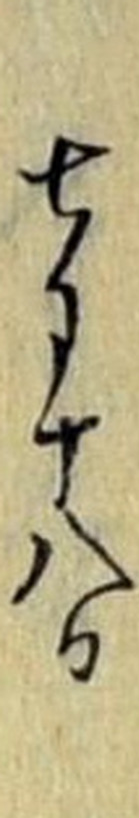七月十八日
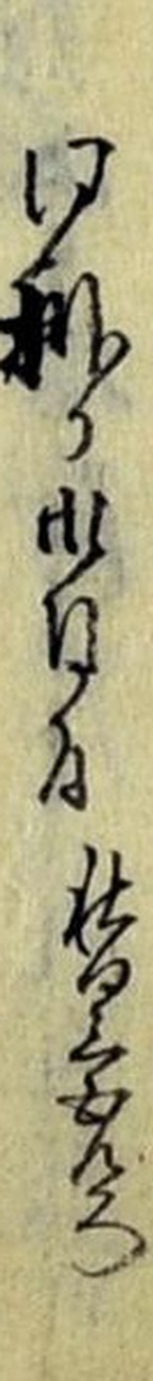同掛り御目付秋田三五左衛門
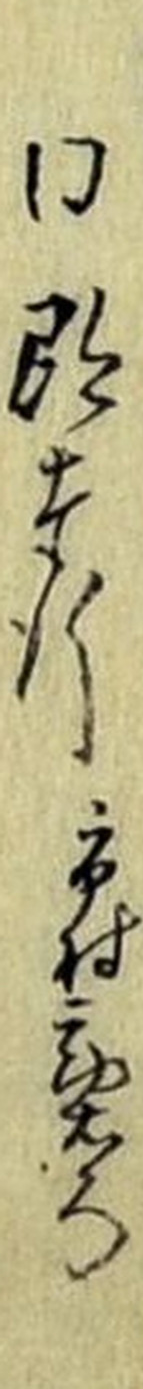同郡奉行市村勘右衛門
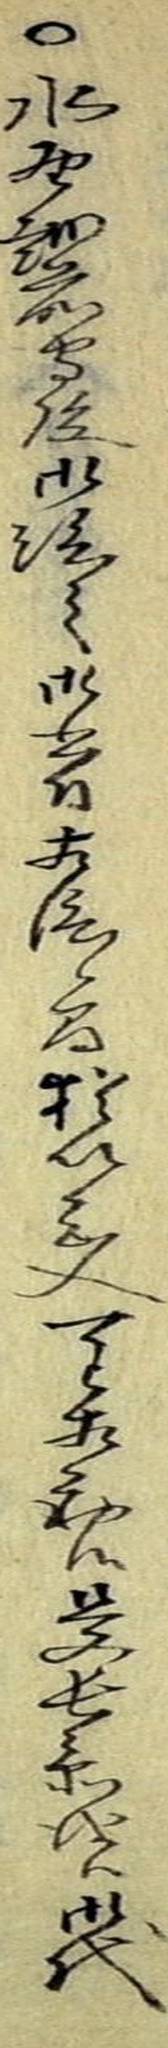○水野越前守殿御渡之御書付相渡候間猶以念入可被相勤候且又長兵衛儀は御代
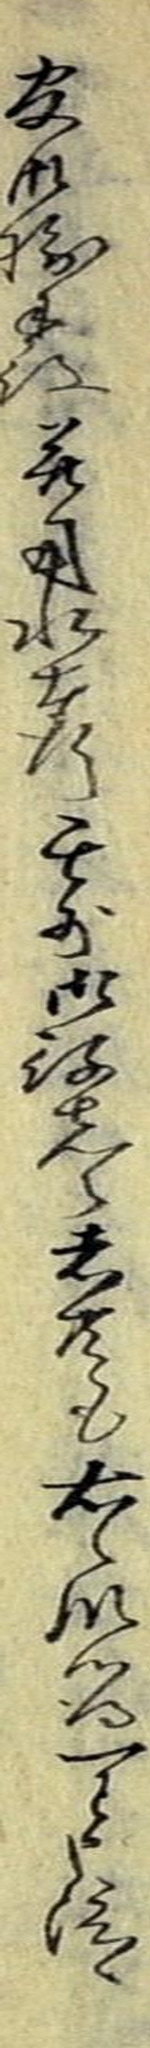官御勝手役并用水奉行其外御役先之者共へも右之段心得可被申渡候
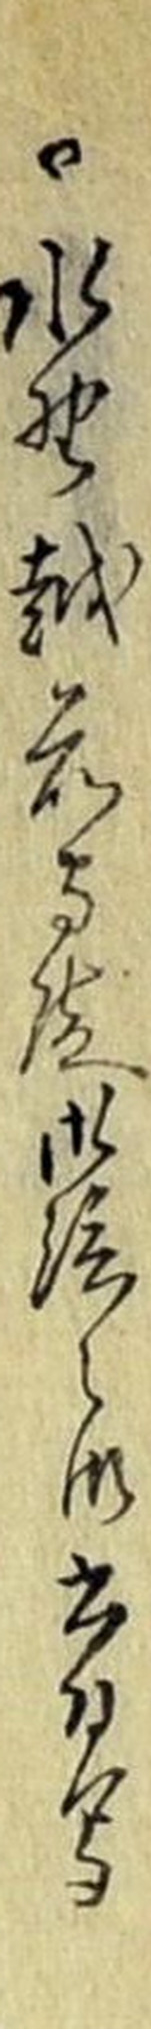○水野越前守殿御渡之御書付写
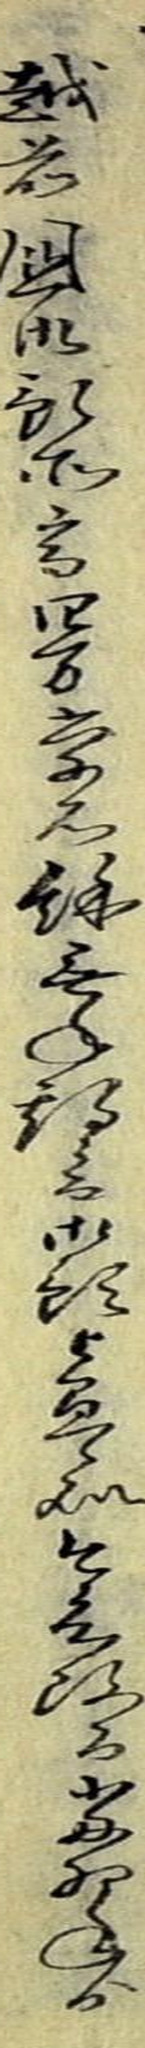越前国御預所高四万六千石餘無年期に而御預被置候処今度改而当卯年ゟ
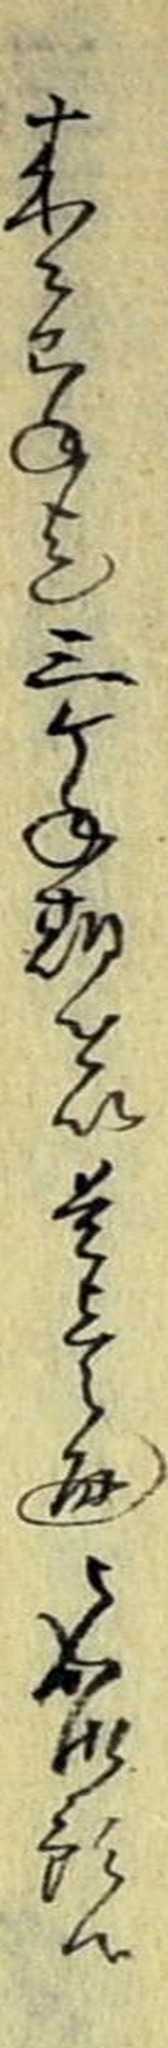来々己年迄三ヶ年期を以是迄之通被成御預候
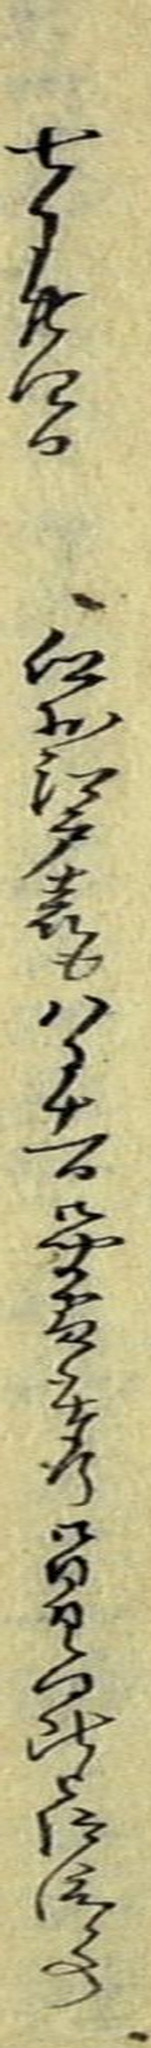七月廿四日但於江戸表も八月十一日御聞番御奉行御目付へ同断被仰渡候事
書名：命令之部 六
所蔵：福井県文書館 Fukui Prefectural Archives
